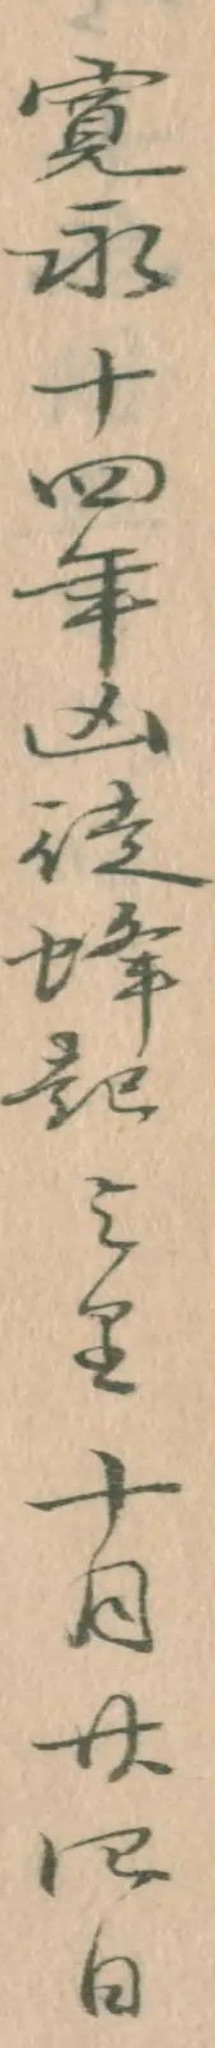寛永十四年凶徒蜂起より十月廿四日
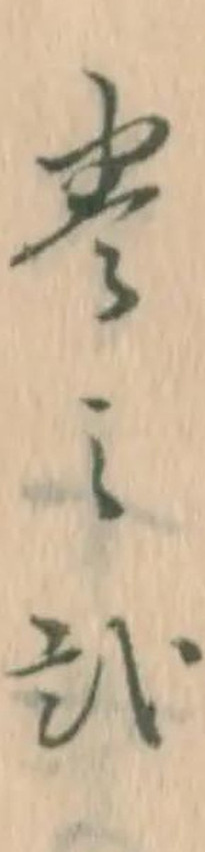巻之壱
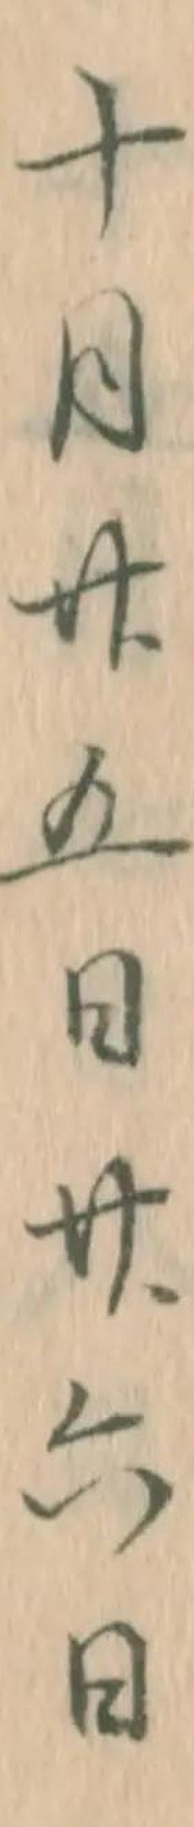十月廿五日廿六日
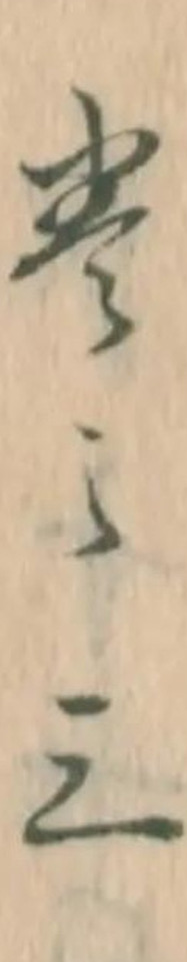巻之三
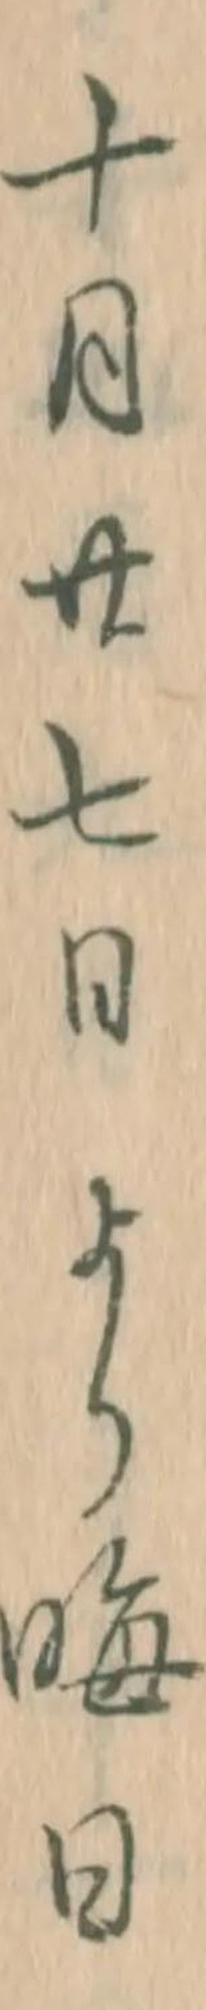十月廿七日より晦日

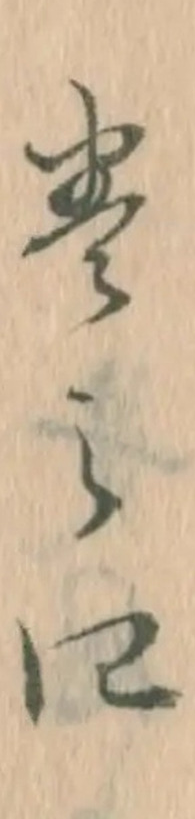巻之四
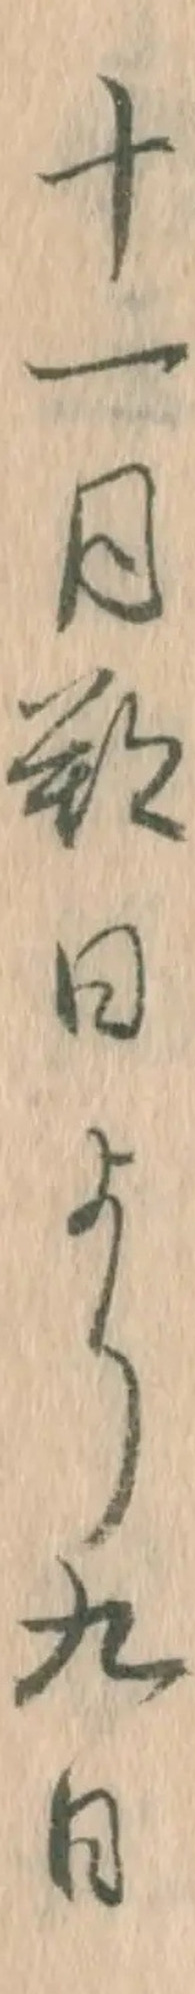十一月朔日より九日
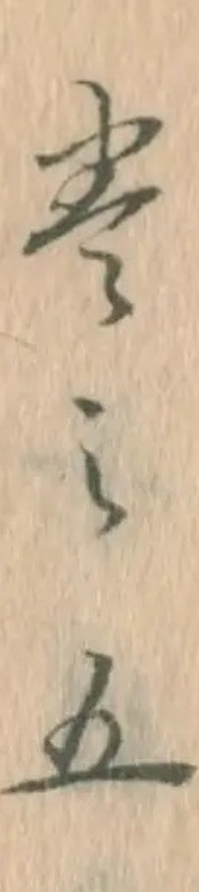巻之五
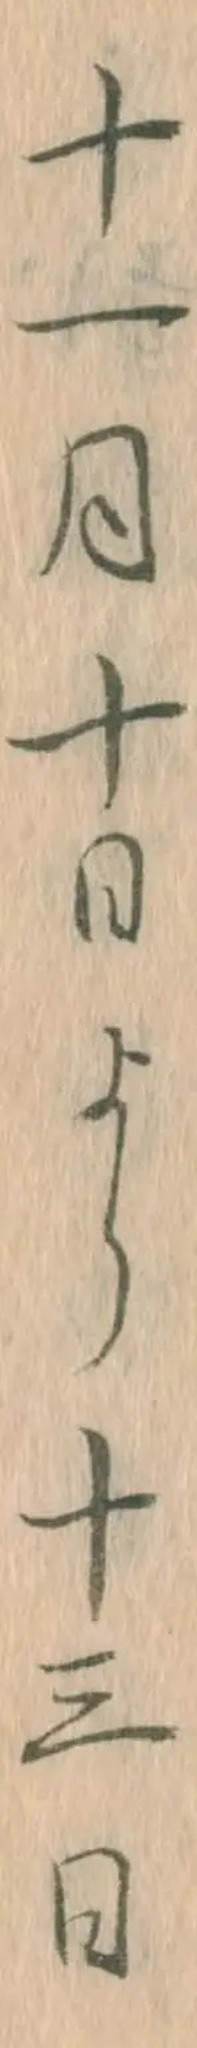十一月十日より十三日
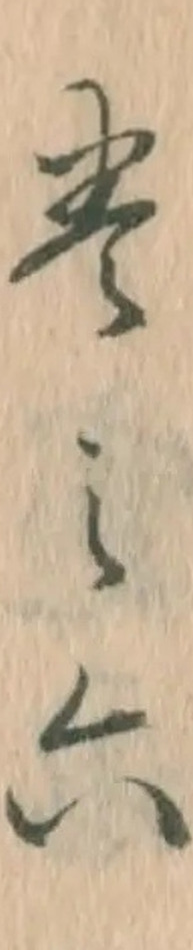巻之六
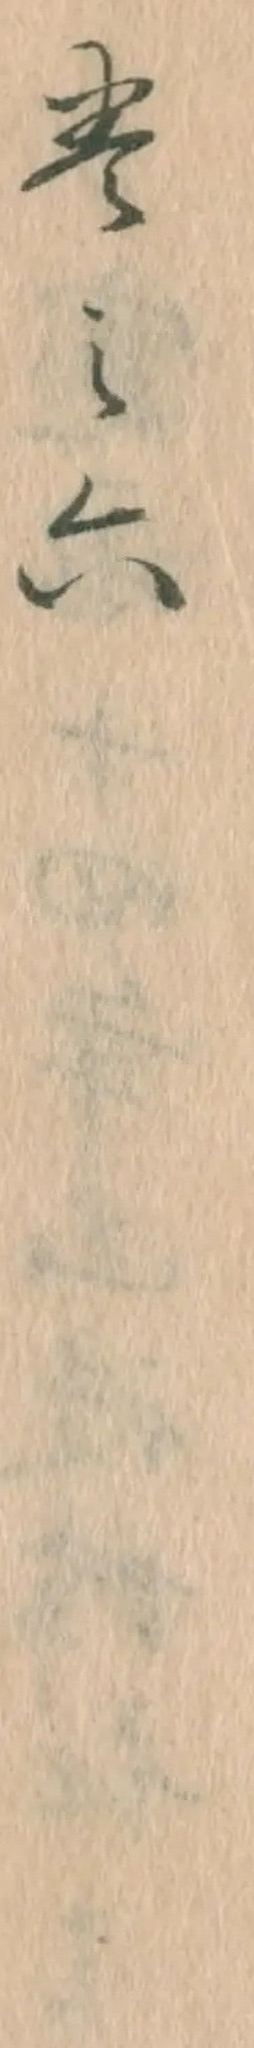巻之六
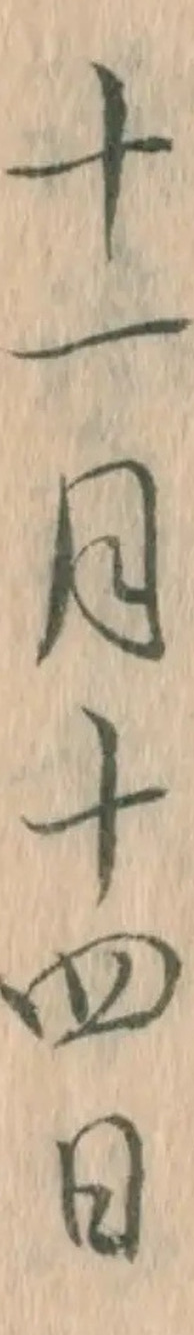十一月十四日
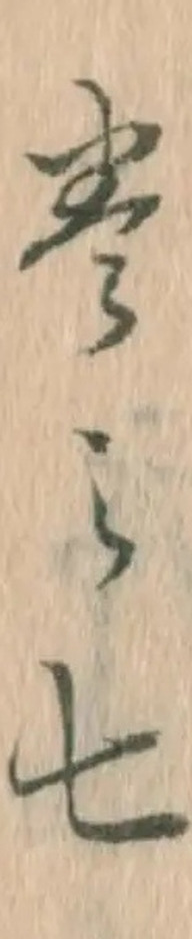巻之七
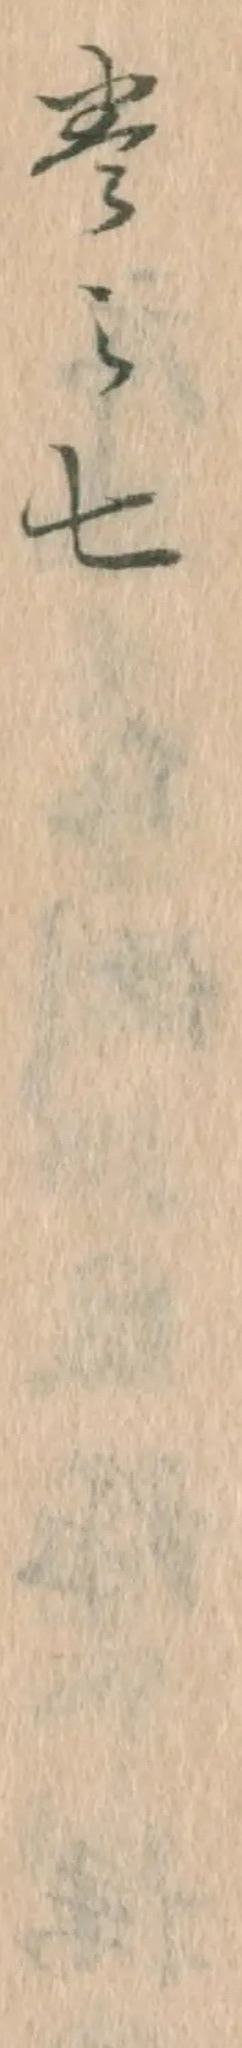巻之七
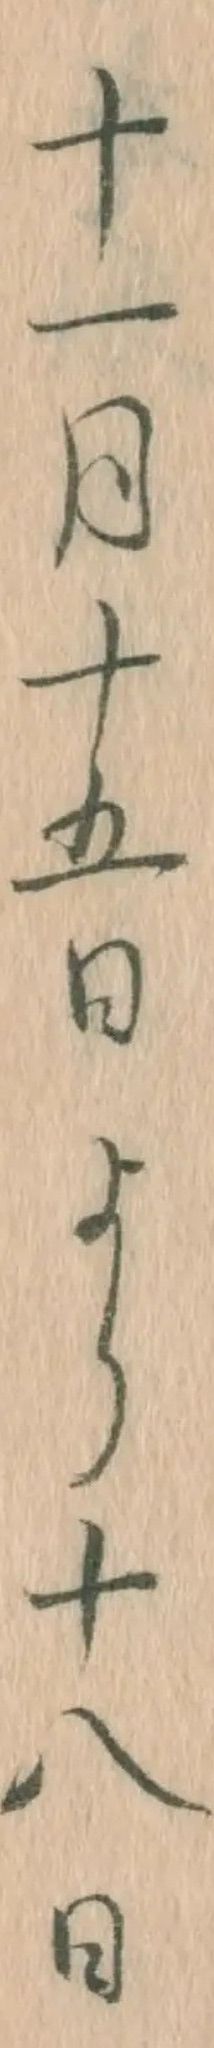十一月十五日より十八日
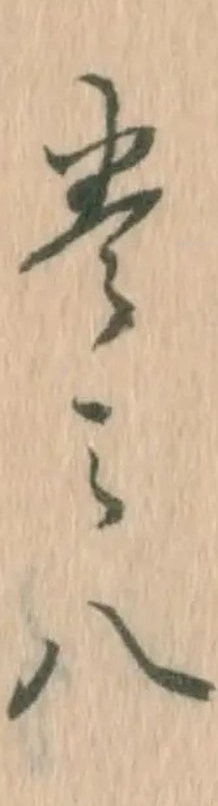巻之八
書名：切支丹御退治記 49巻. [1]
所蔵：国立国会図書館 National Diet Library, JAPAN
